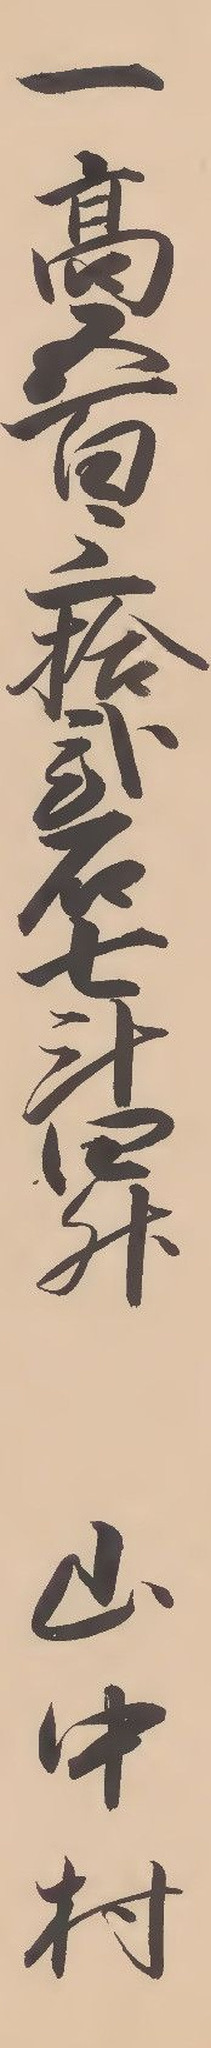一高五百三拾弐石七斗四升山中村
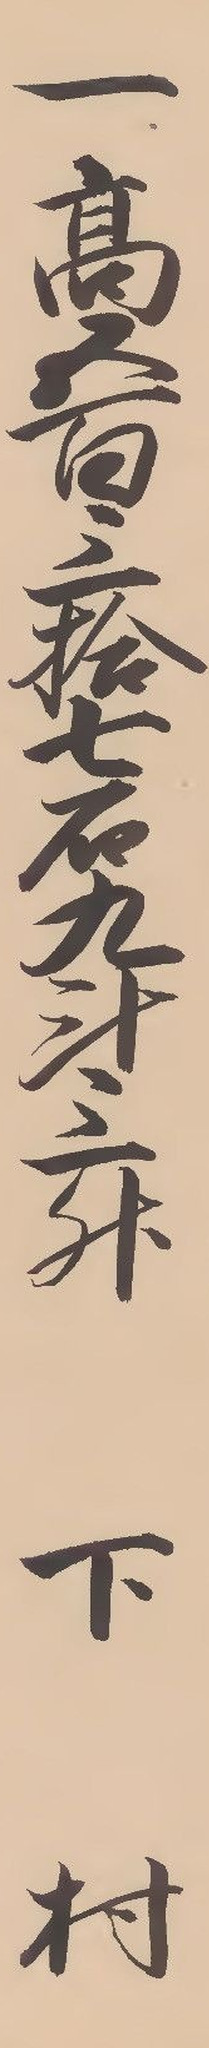一高五百三拾七石九斗三升下村
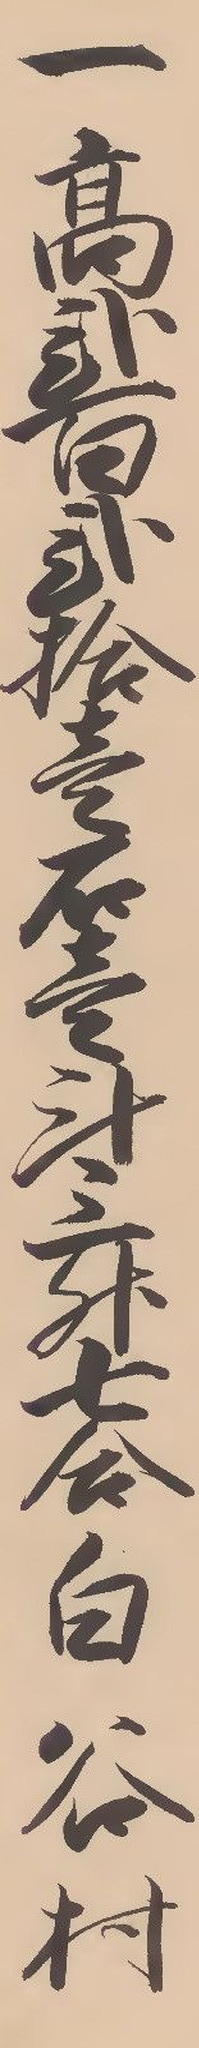一高弐百弐拾壱石壱斗三升七合白谷村

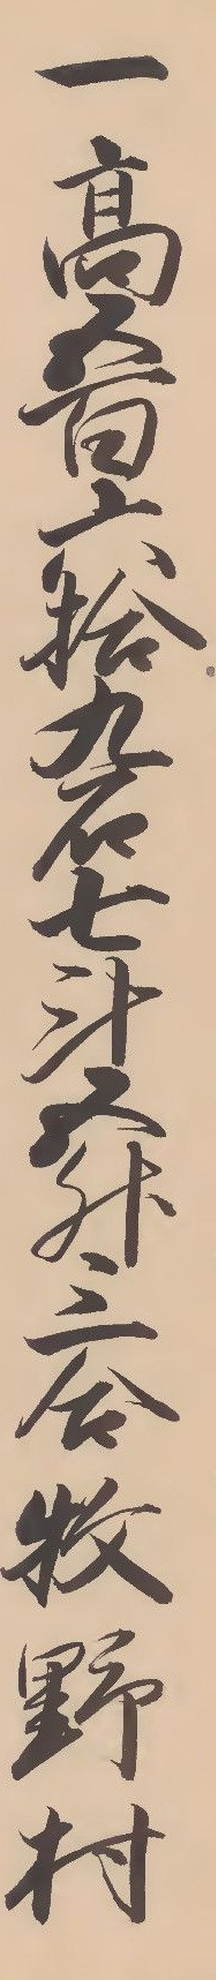一高五百六拾九石七斗五升三合牧野村
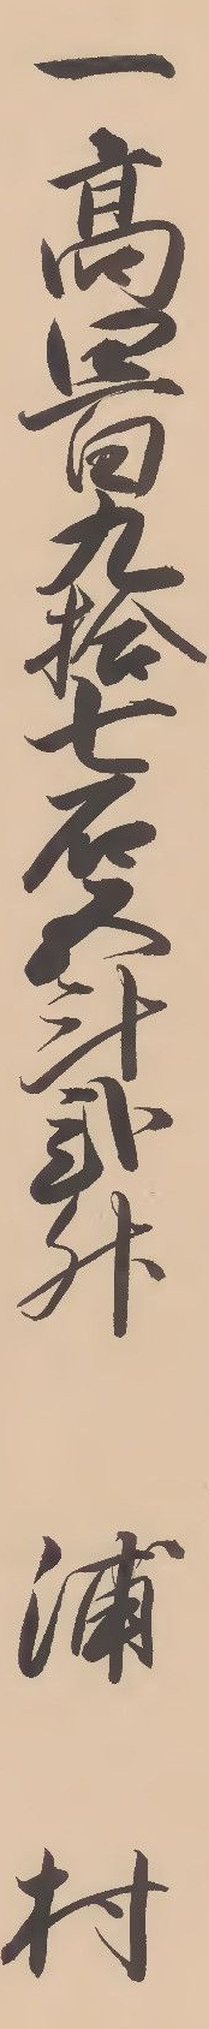一高四百九拾七石五斗弐升浦村
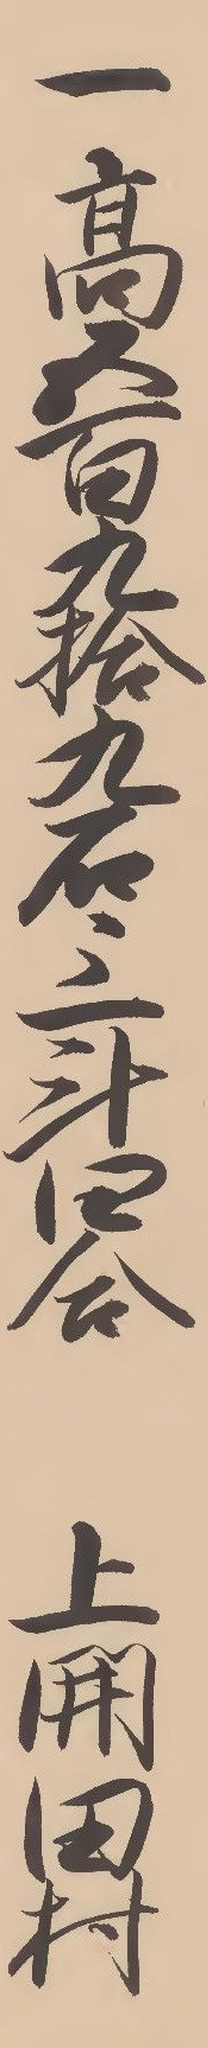一高五百九拾九石三斗四合上開田村
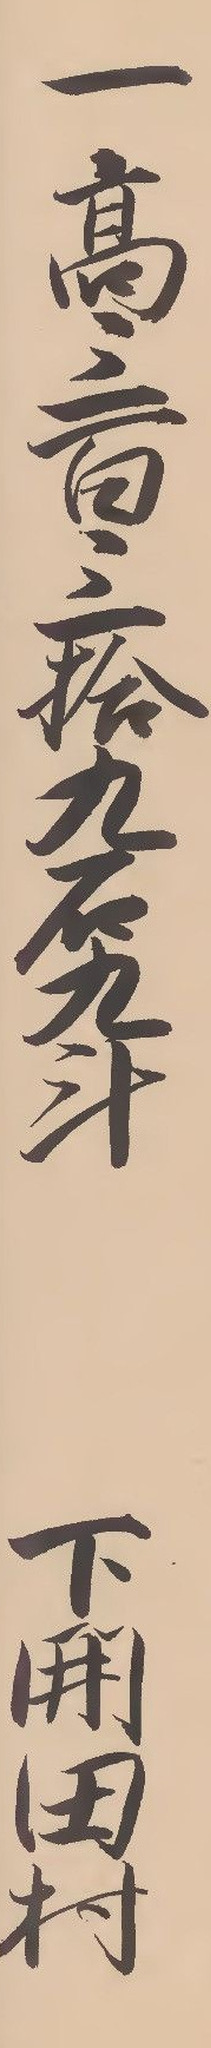一高三百三拾九石九斗下開田村
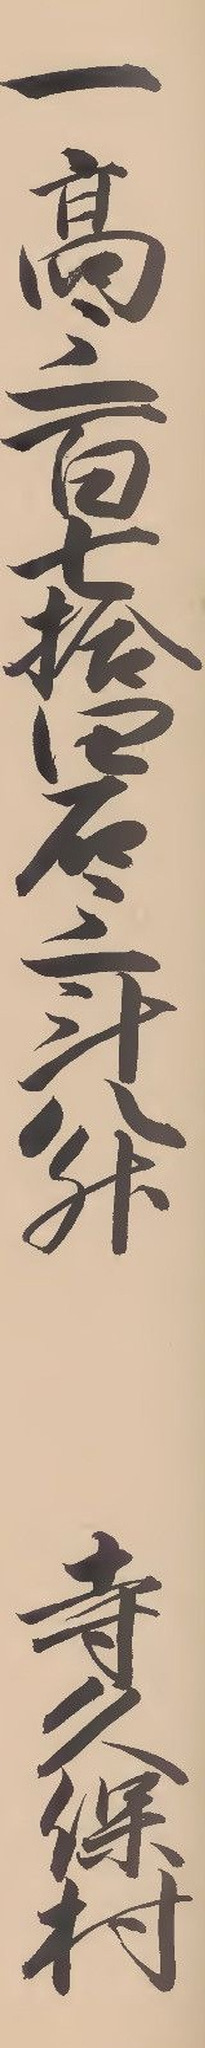一高三百七拾四石三斗八升寺久保村
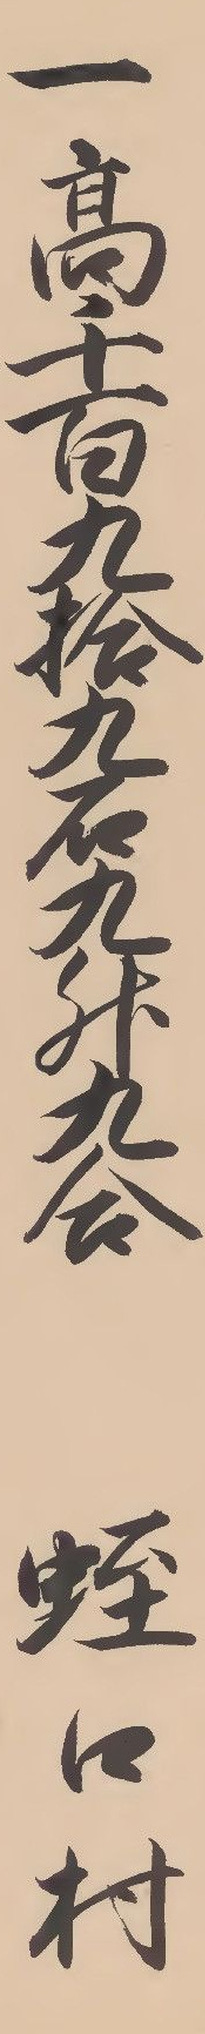一高千百九拾九石九升九合蛭口村
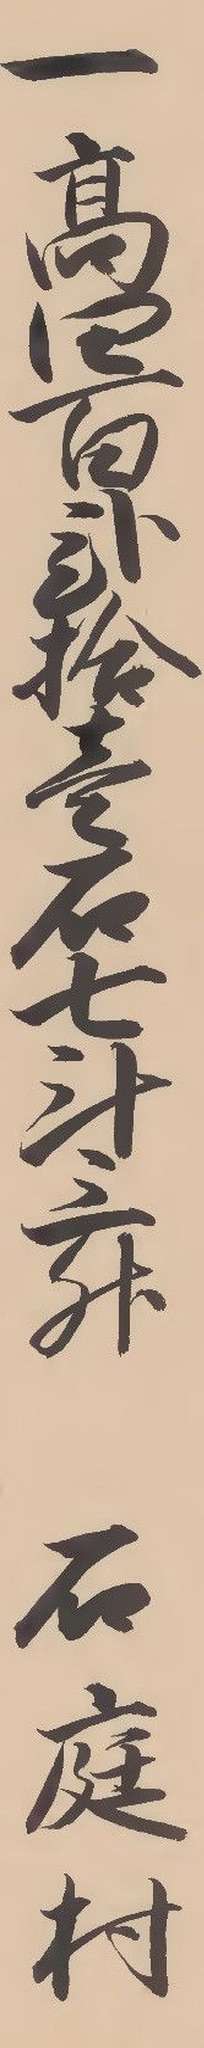一高四百弐拾壱石七斗三升石庭村
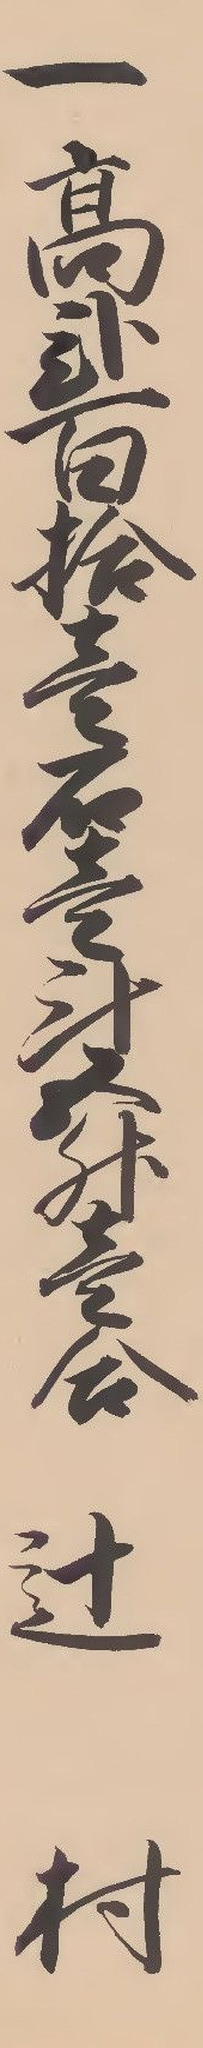一高弐百拾壱石壱斗五升壱合辻村

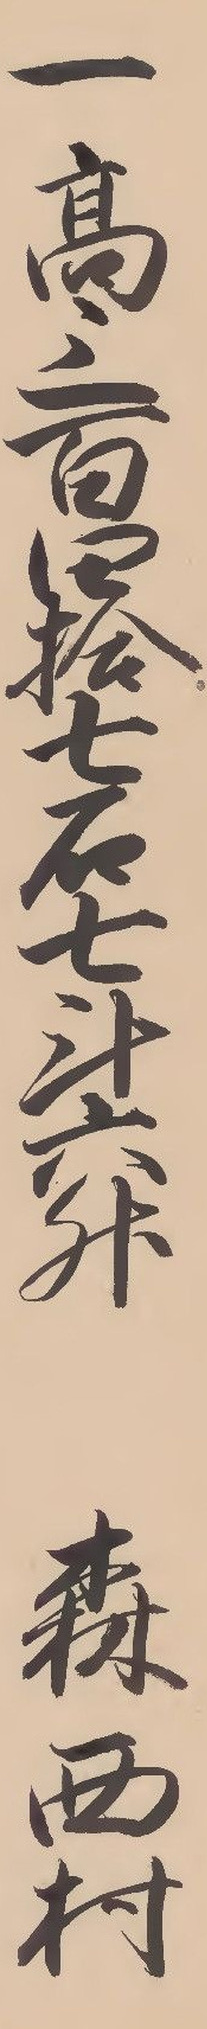一高三百四拾七石七斗六升森西村
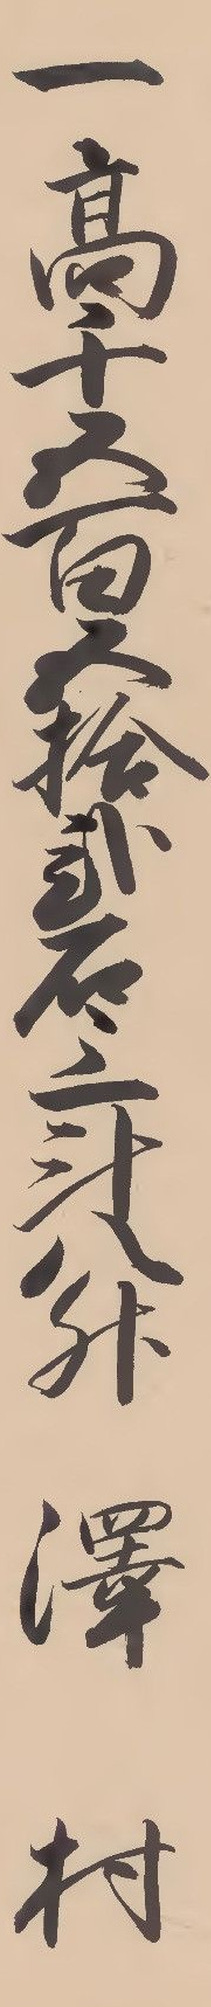一高千五百五拾弐石三斗八升沢村
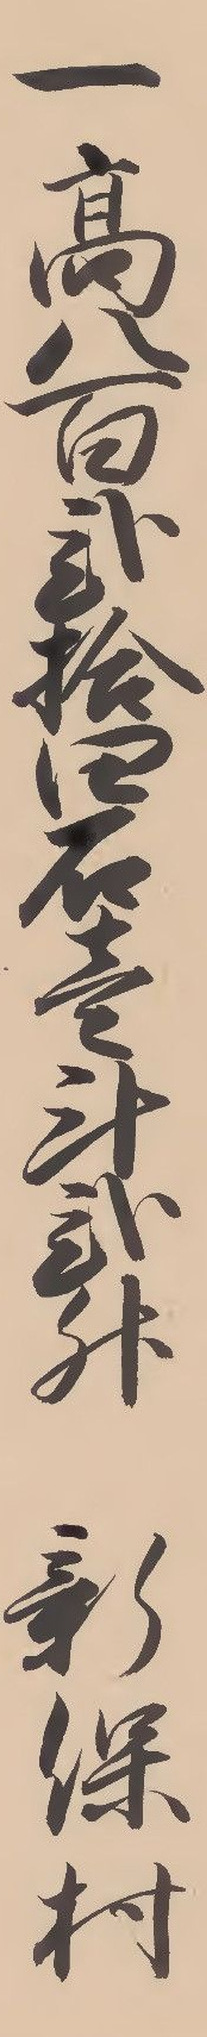一高八百弐拾四石壱斗弐升新保村
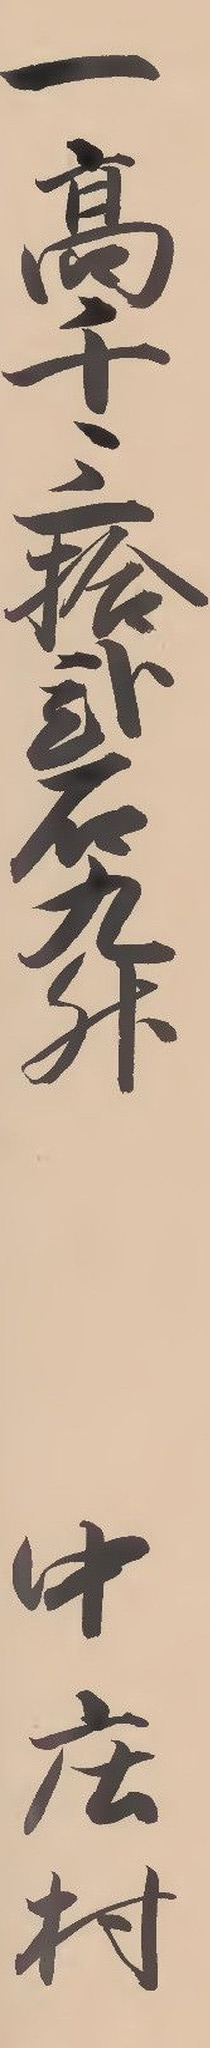一高千三拾弐石九升中庄村
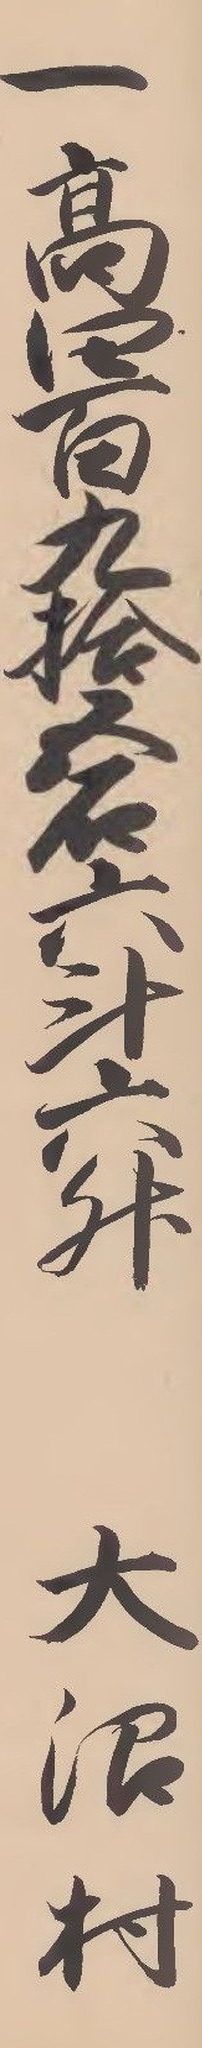一高四百九拾五石六斗六升大沼村
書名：近江国郷帳
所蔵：国立公文書館 National Archives of Japan
